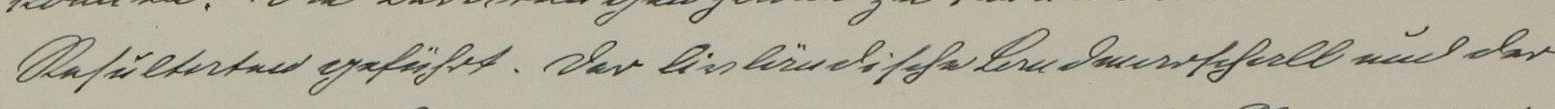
Resultaten geführt. Der livländische Landmarschall und der
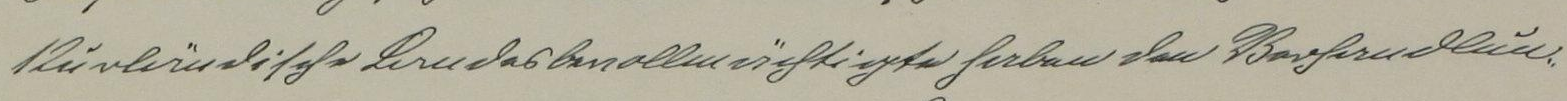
kurländische Landesbevollmächtigte haben den Verhandlun-
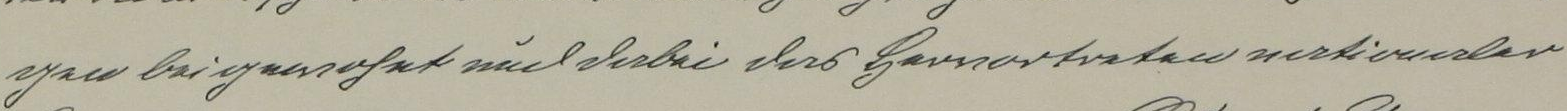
gen beigewohnt und dabei das Hervortreten nationaler
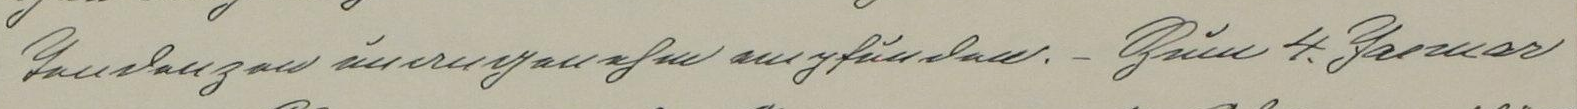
Tendenzen unangenehm empfunden. – Zum 4. Januar
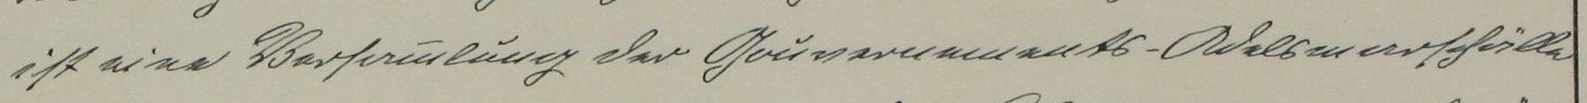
ist eine Versammlung der Gouvernements-Adelsmarschälle
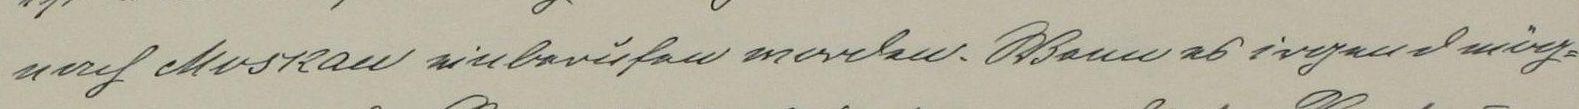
nach Moskau einberufen worden. Wenn es irgendmög-
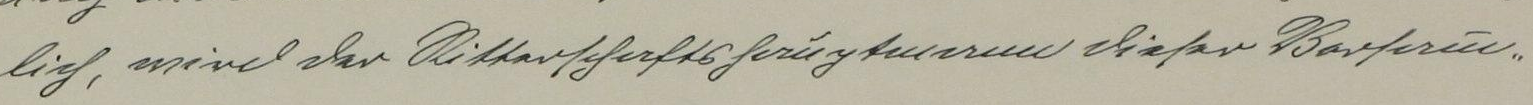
lich, wird der Ritterschaftshauptmann dieser Versamm-
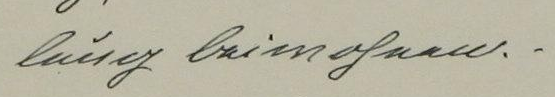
lung beiwohnen.
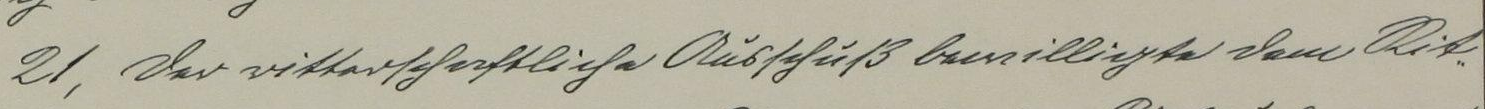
21. Der ritterschaftliche Ausschuß bewilligte dem Rit-
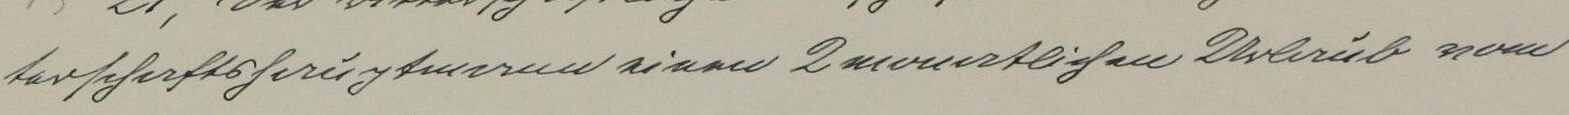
terschaftshauptmann einen 2monatigen Urlaub vom
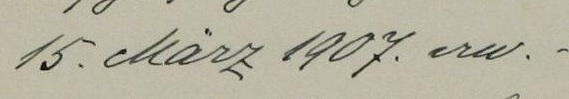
15. März 1907. an.
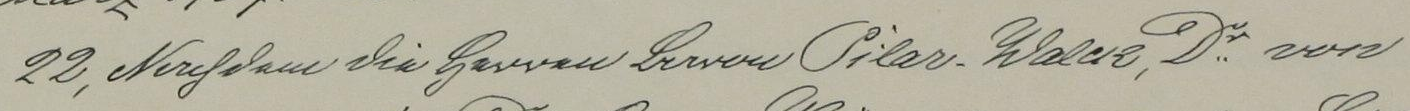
22. Nachdem die Herren Baron Pilar-Walck, Dr. von
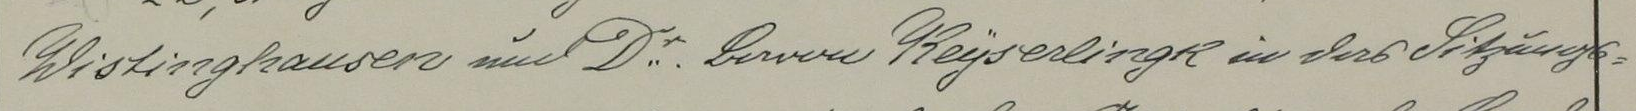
Wistinghausen und Dr. Baron Keyserlingk in das Sitzungs-
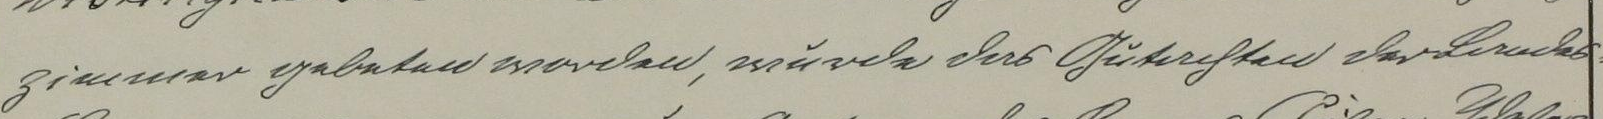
zimmer gebeten worden, wurde das Gutachten der Landes-
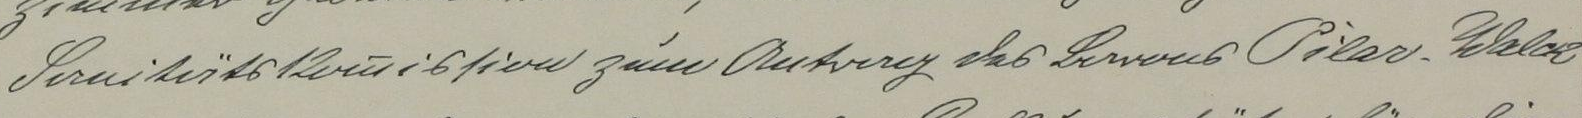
Sanitätskommission zum Antrag des Barons Pilar-Walck
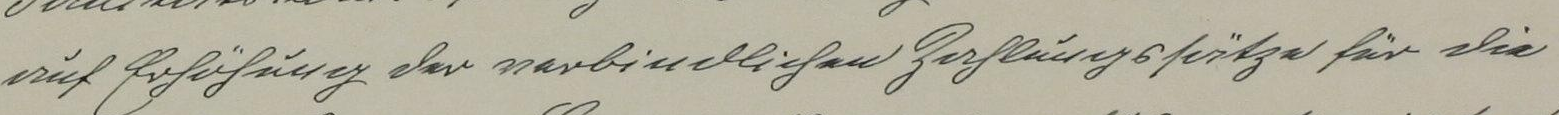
auf Erhöhung der verbindlichen Zahlungssätze für die
